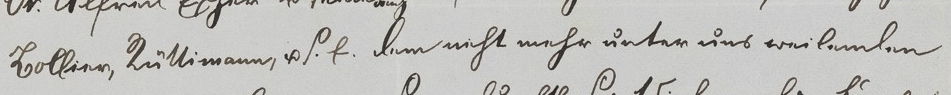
Bollier, Rüttimann, &s. f. dem nicht mehr unter uns weilenden
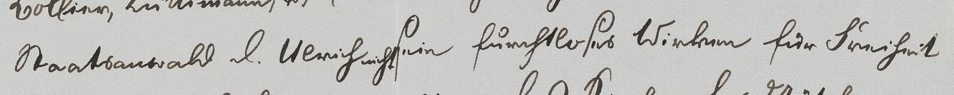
Staatsanwald D. Ulrich nicht sein furchtloses Wirken für Freiheit
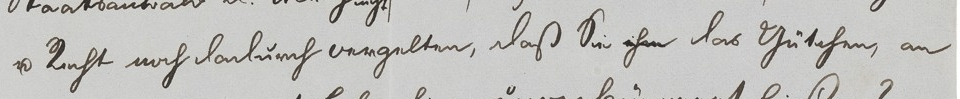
& Recht noch dadurch vergelten, daß Sie ihm das Gütchen, an
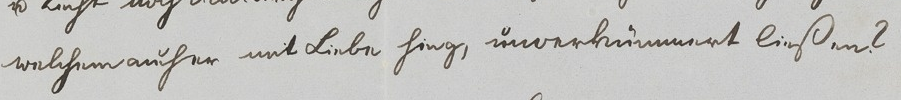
welchem auch er mit Liebe hing, unverkümmert ließen?
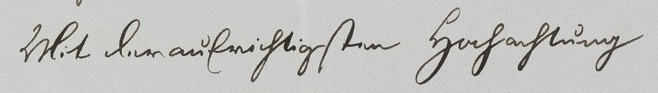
Mit der aufrichtigsten Hochachtung
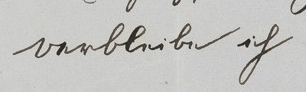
verbleibe ich
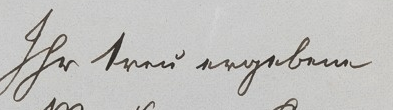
Ihr treu ergebener
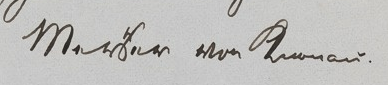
Meyer von Knonau.
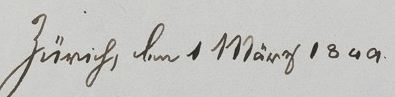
Zürich, den 1 März 1849.
